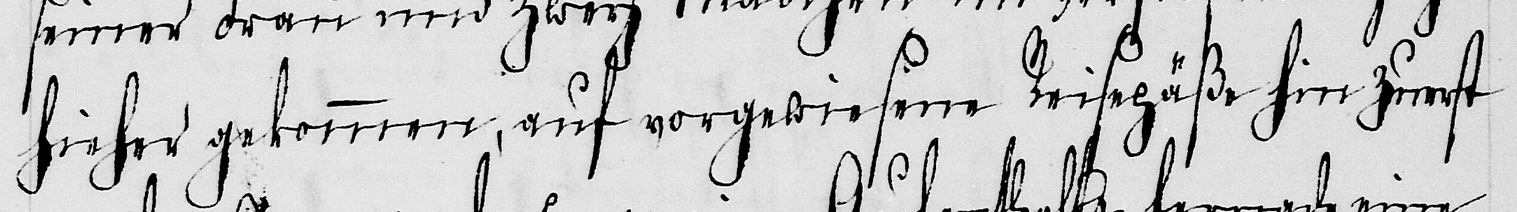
hieher gekommen, auf vorgewiesene Reisepäße hin zuerst
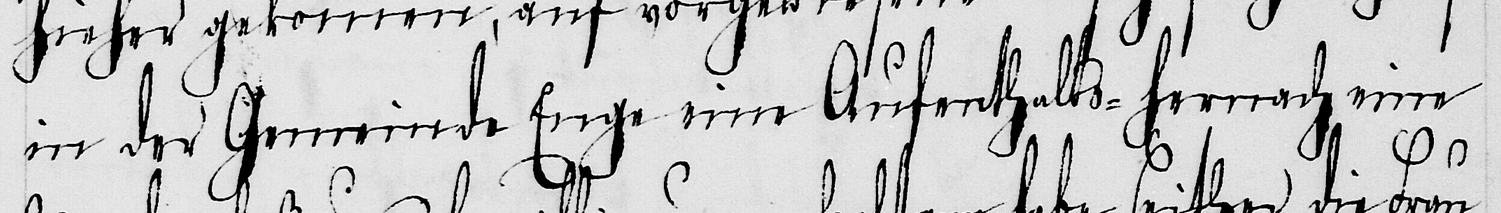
in der Gemeinde Enge eine Aufenthalts- hernach eine
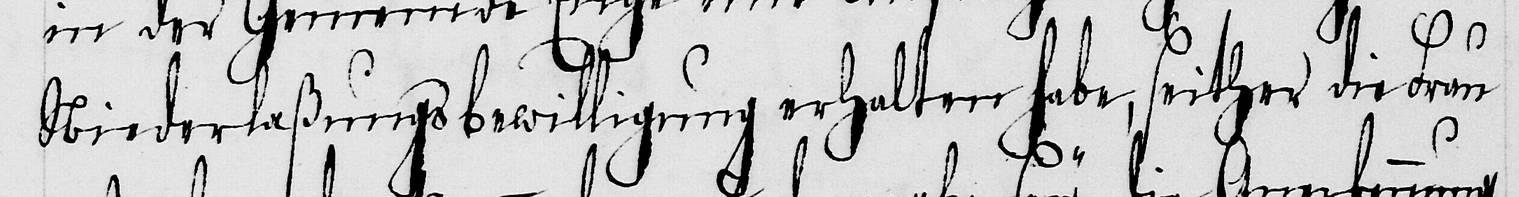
Niederlaßungsbewilligung erhalten habe, seither die Frau
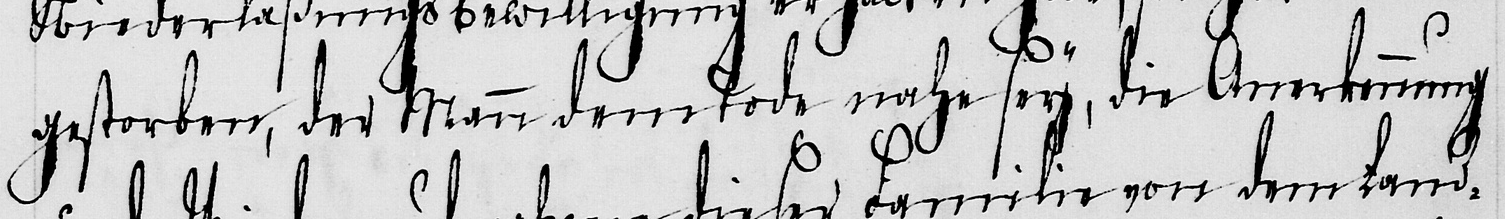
gestorben, der Mann dem Tode nahe sey, die Anerkennung
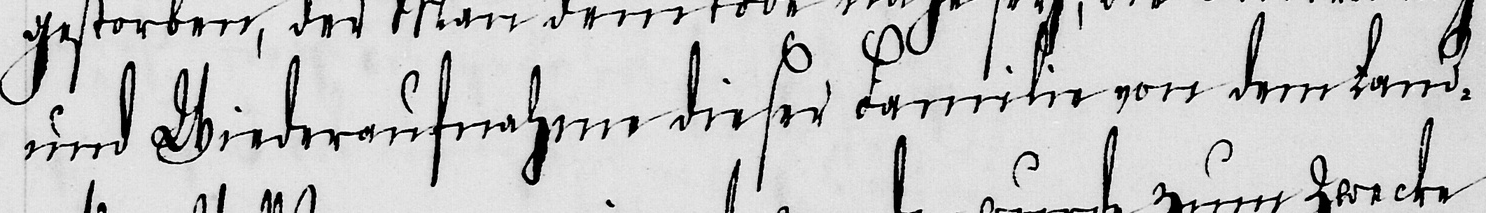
und Wiederaufnahme dieser Familie von dem Land¬
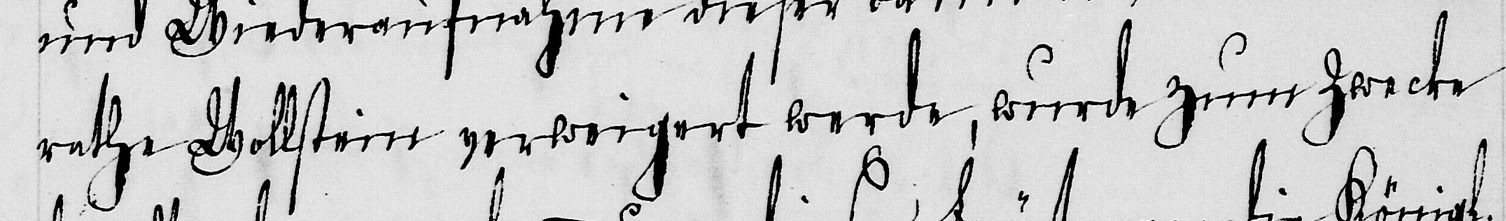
rathe Wollstein verweigert werde, wurde zum Zwecke
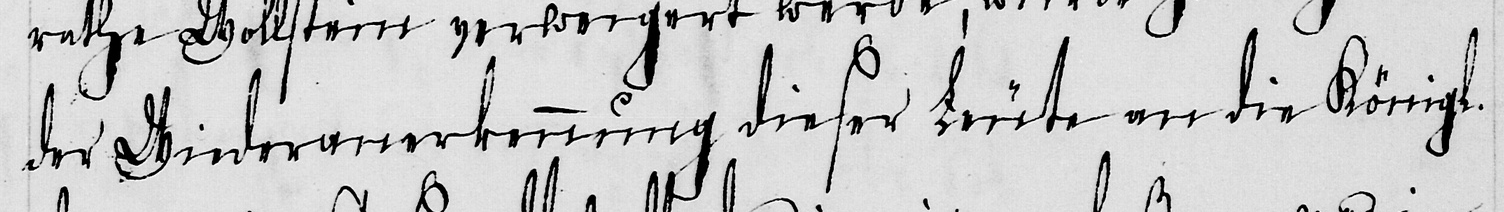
der Wiederanerkennung dieser Leute an die Königl.
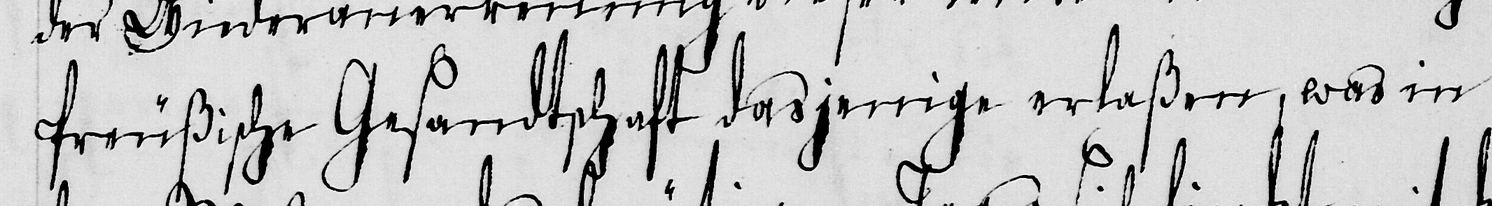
Preußische Gesandtschaft dasjenige erlaßen, was in
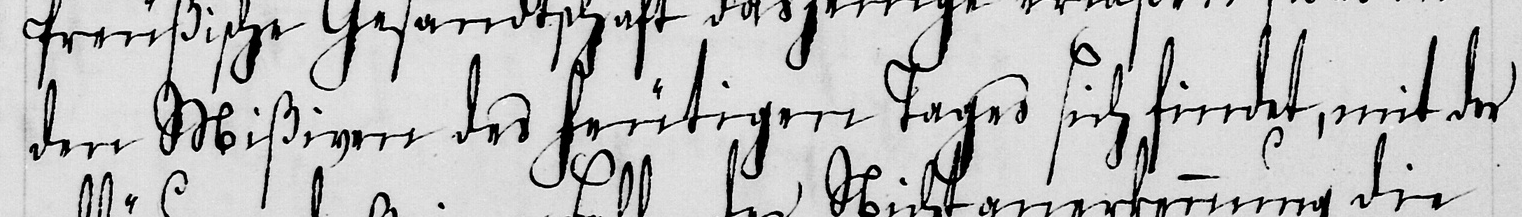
den Mißiven des heutigen Tages sich findet, mit der
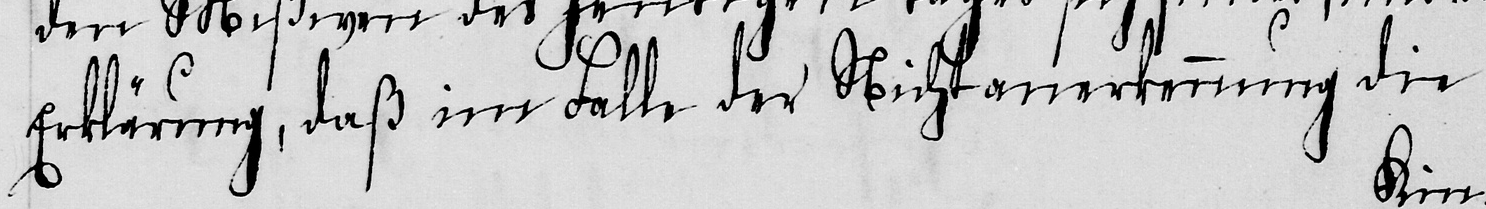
Erklärung, daß im Falle der Nichtanerkennung die
